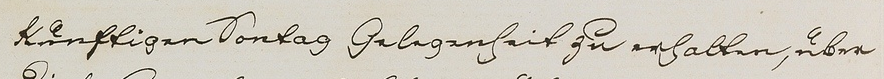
künftigen Sontag Gelegenheit zu erhalten, über
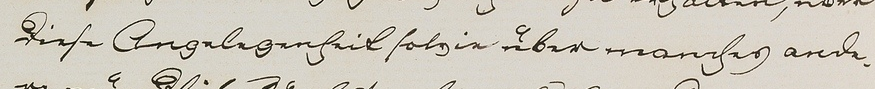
diese Angelegenheit sowie über manches ande-
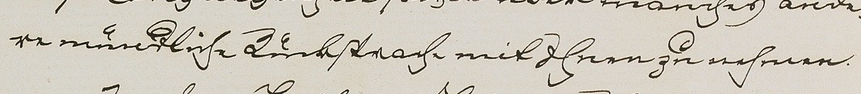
re mündliche Rücksprache mit Ihnen zu nehmen.
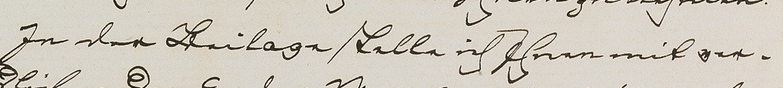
In der Beilage stelle ich Ihnen mit ver-
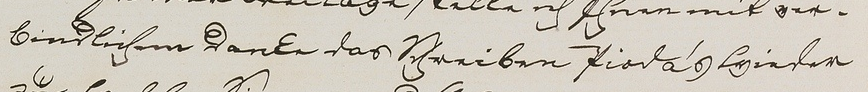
bindlichem Danke das Schreiben Pioda's wieder
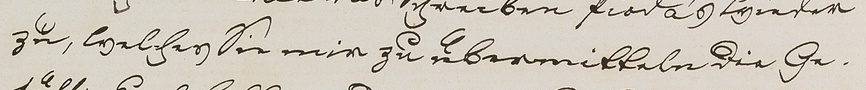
zu, welches Sie mir zu übermitteln die Ge-
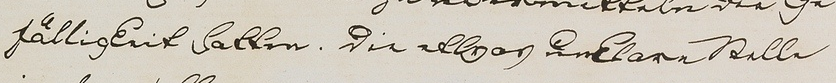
fälligkeit hatten. Die etwas unklare Stelle
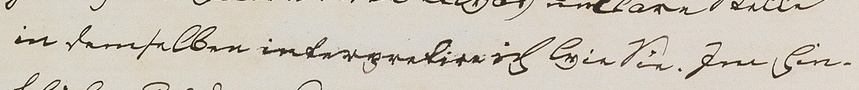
in demselben interpretire ich wie Sie. Im Hin-
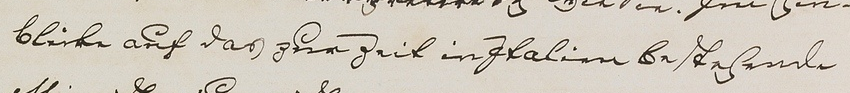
blicke auf das zur Zeit in Italien bestehende
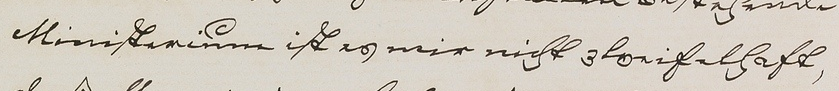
Ministerium ist es mir nicht zweifelhaft,
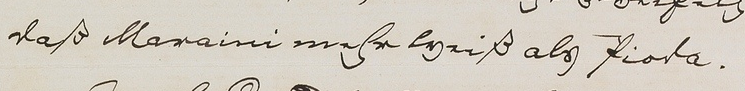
daß Maraini mehr weiß als Pioda.
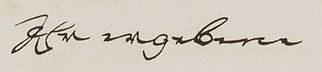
Ihr ergebene
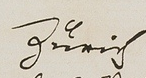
Zürich
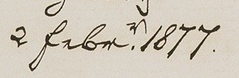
2 Febrr 1877.
